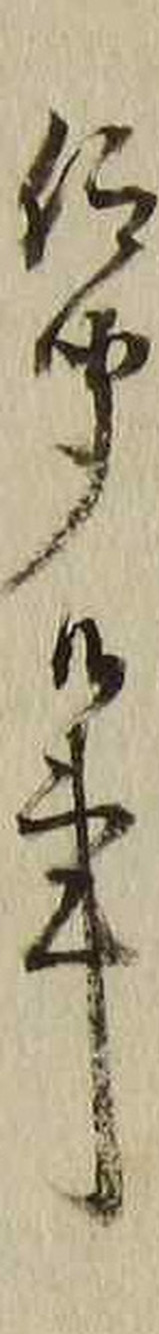仰聞候事
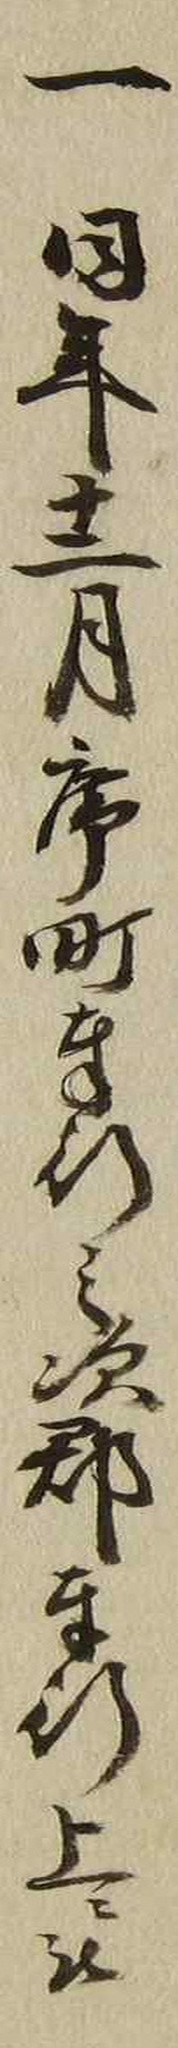一同年十二月席町奉行之次郡奉行上ニ被
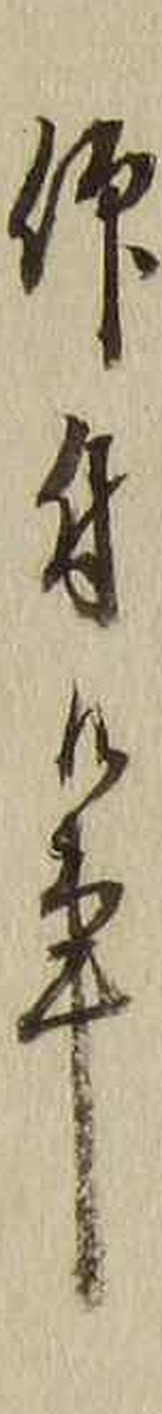仰付候事
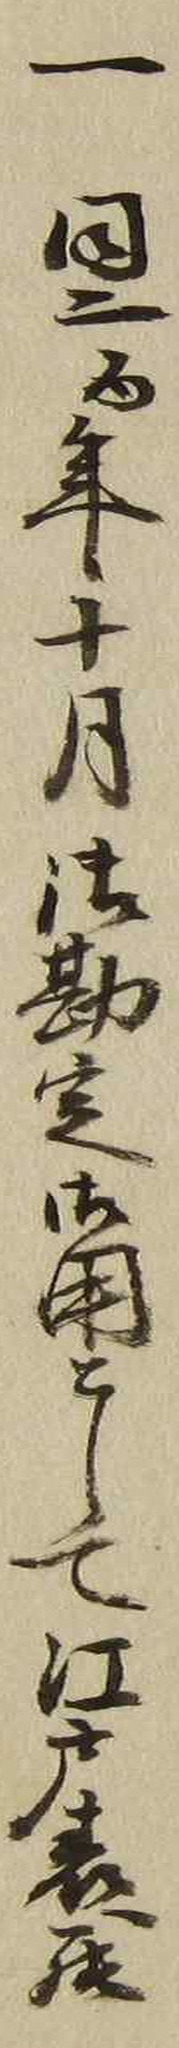一同二酉年十月御勘定御用として江戸表江罷

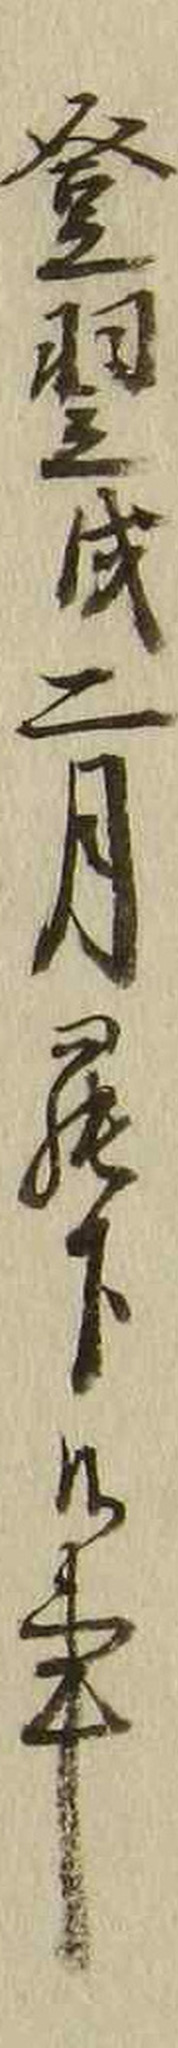登翌戌二月罷下候事
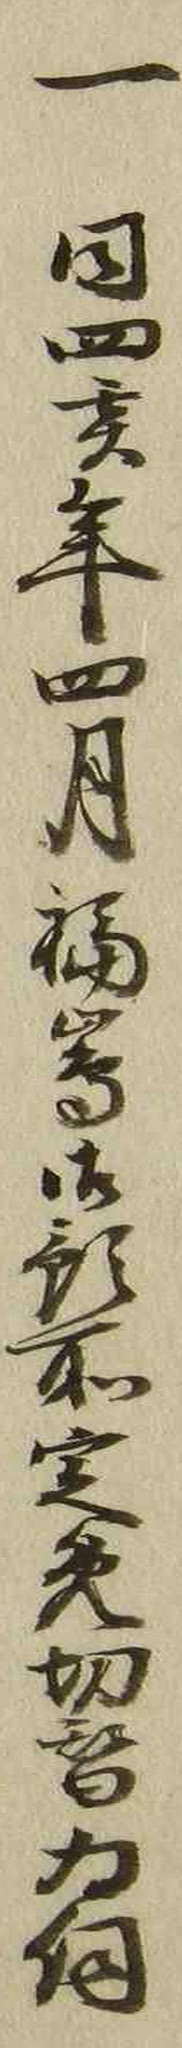一同四亥年四月福島御預所定免切替為伺
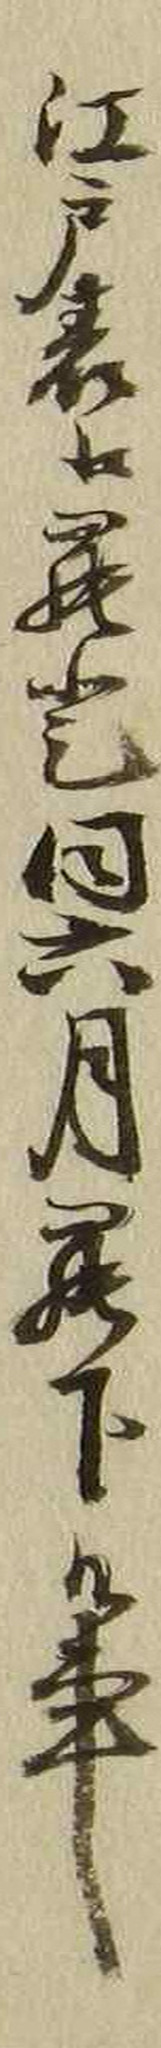江戸表江罷登同六月罷下候事
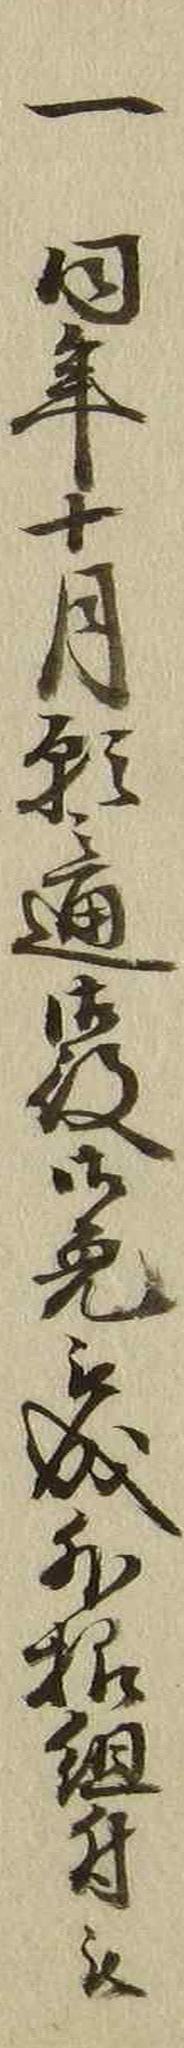一同年十月願之通御役御免被成外様組付被
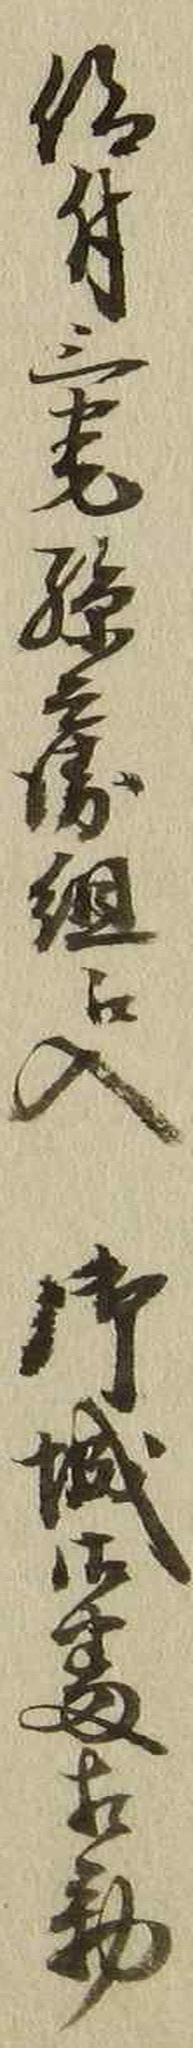仰付三毛孫兵衛組江入御城御番相勤
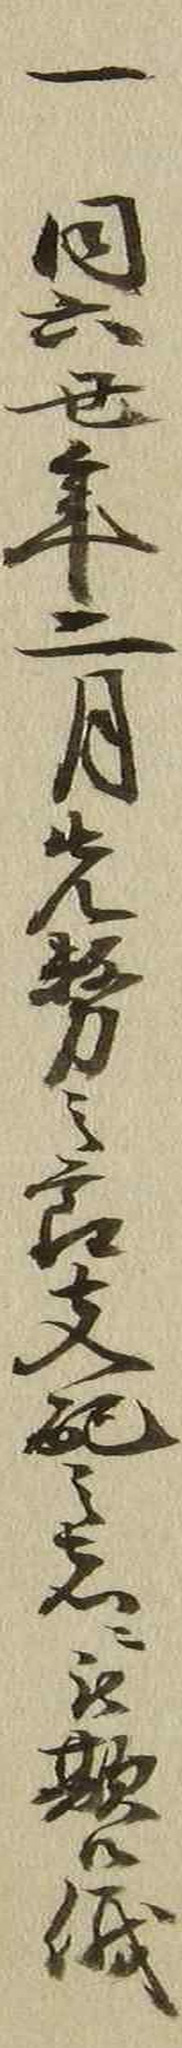一同六丑年二月先努之節支配之者ニ被欺候儀
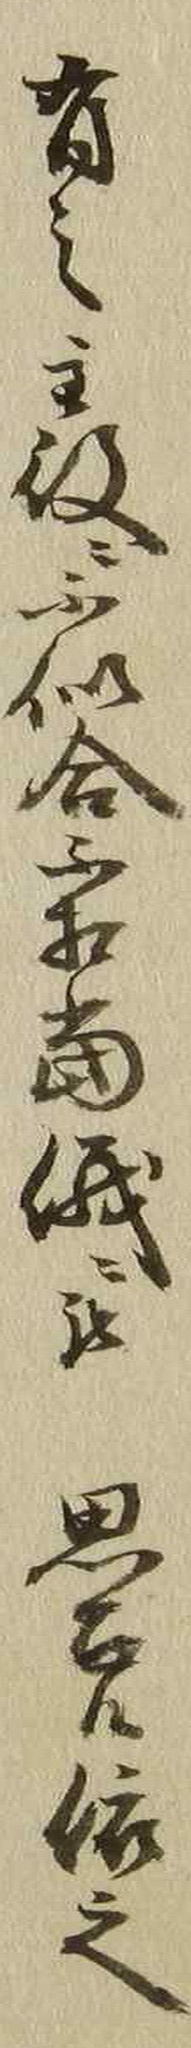有之主役ニ不似合不相当儀ニ被思召候依之
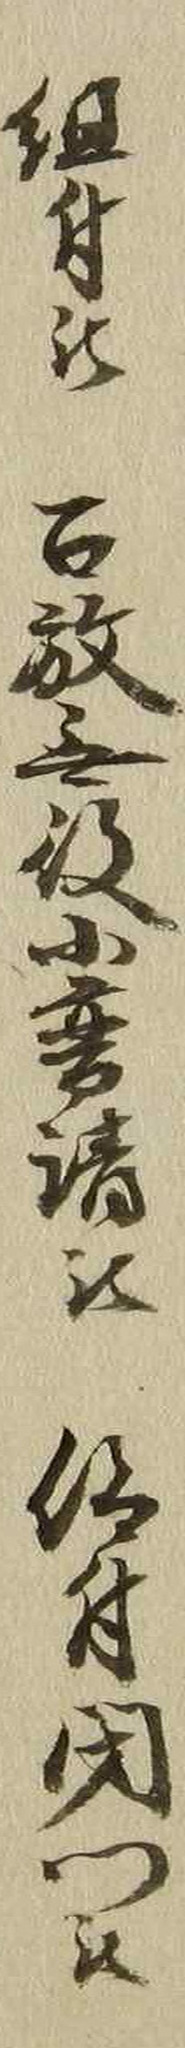組付被召放無役小普請被仰付閉門被
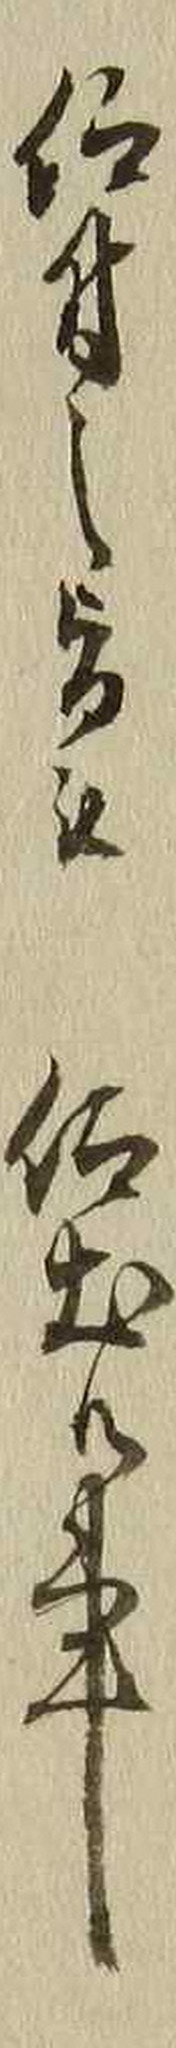仰付之旨被仰出候事
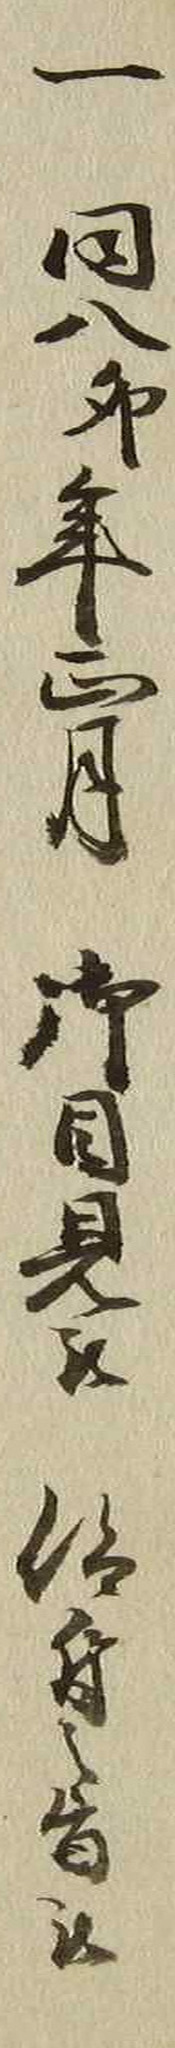一同八卯年正月御目見被仰付之旨被
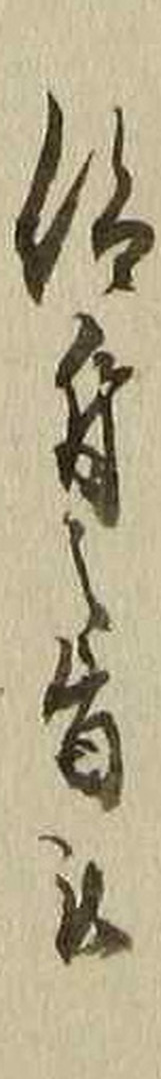仰付之旨被仰出候事
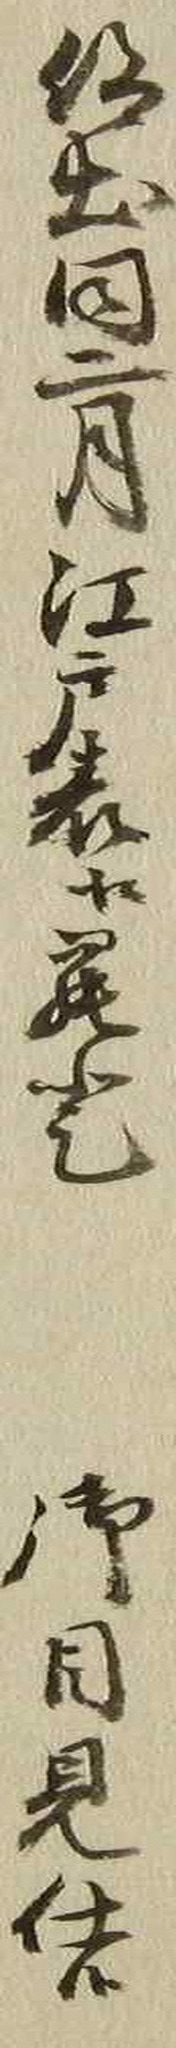仰出同二月江戸表江罷登御目見仕候
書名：諸士系譜　巻之64　と之部7
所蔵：会津若松市立会津図書館
